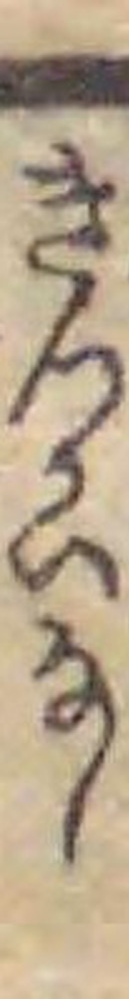きつかいなし
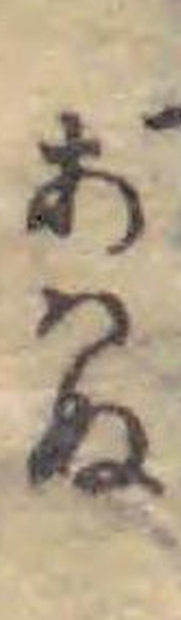あはぬ
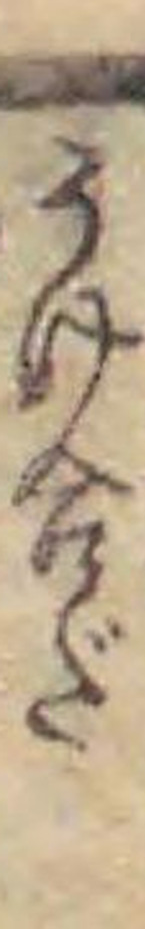うけ合だ
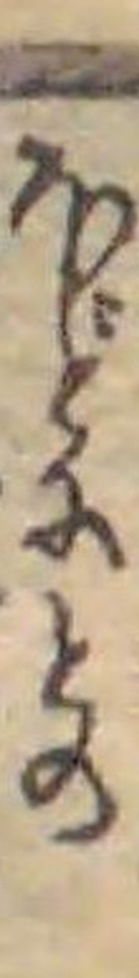ほどにとの

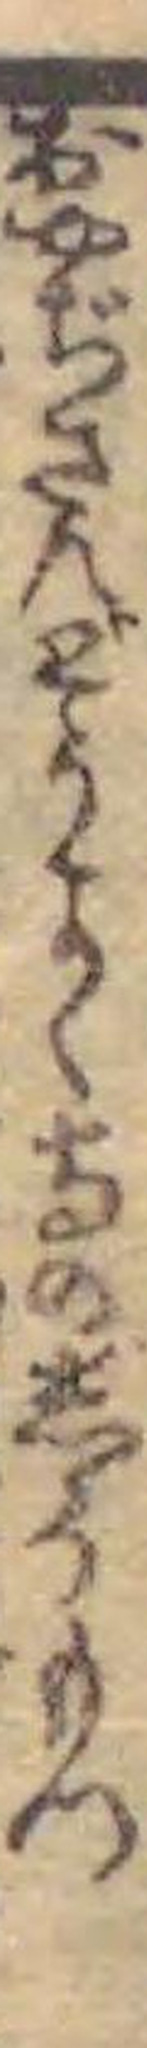をやぢさんどうよく寺のしうもつ
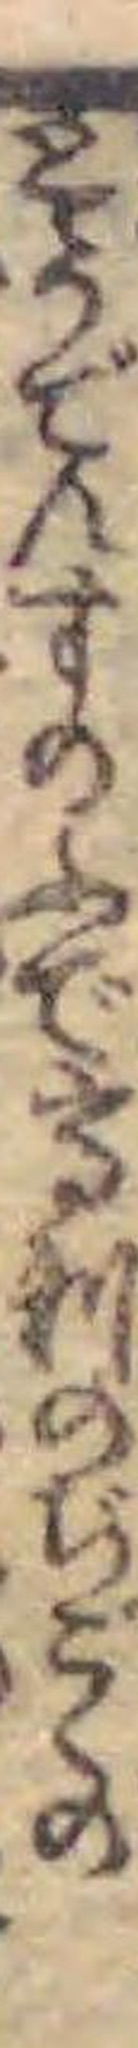とうでんすのふで高利のぢごくの
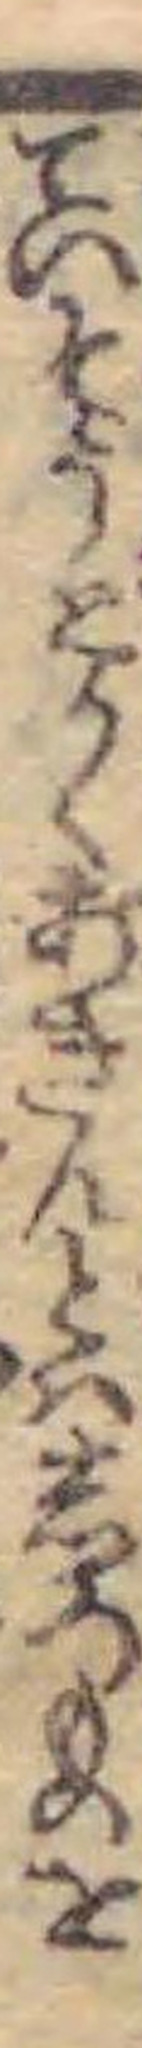ていそうとかくあきんとはしろものを
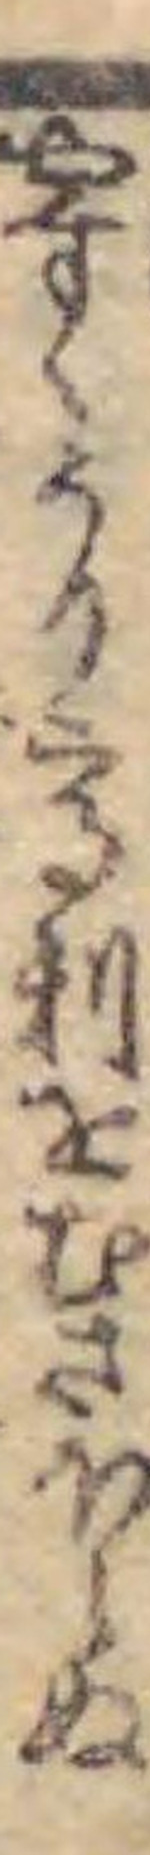やすくうり高利をむさほらぬ
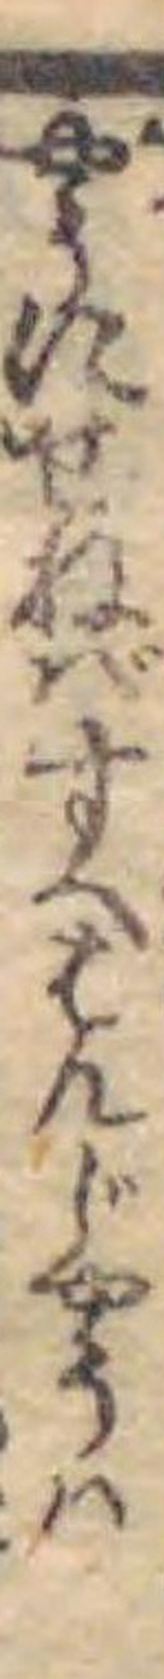やうにせねばすへはんじやうは
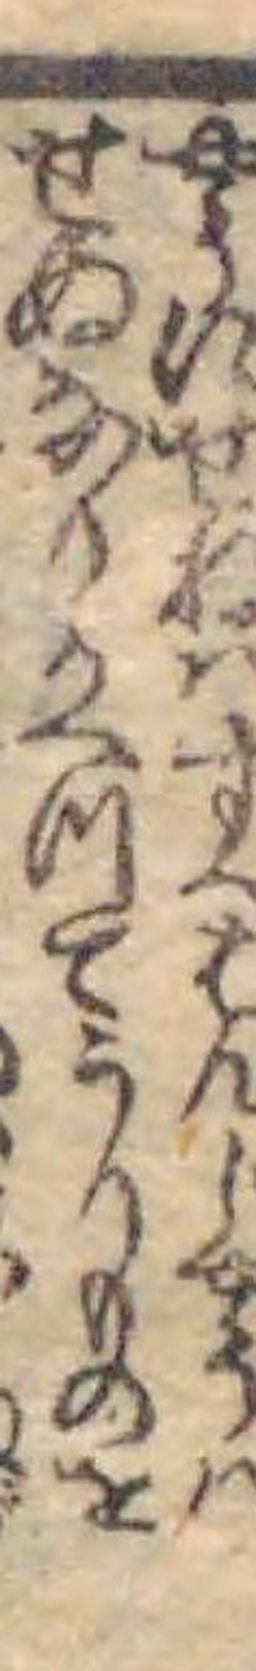せぬなりかへつてうりものを
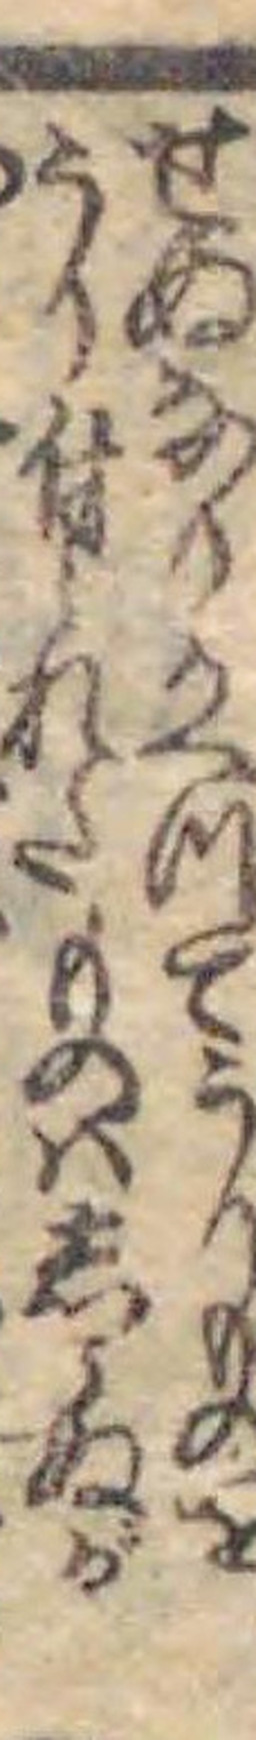うり付られたものはしらぬが
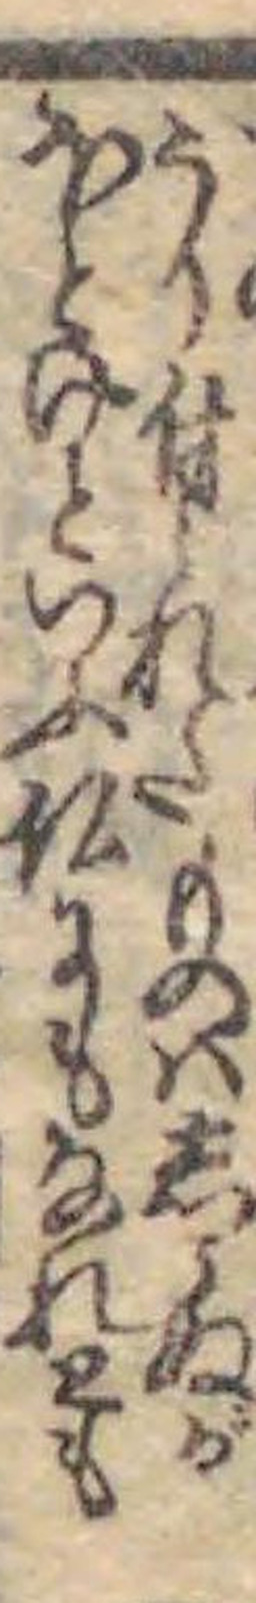ほとけといふ仏にもなれとも
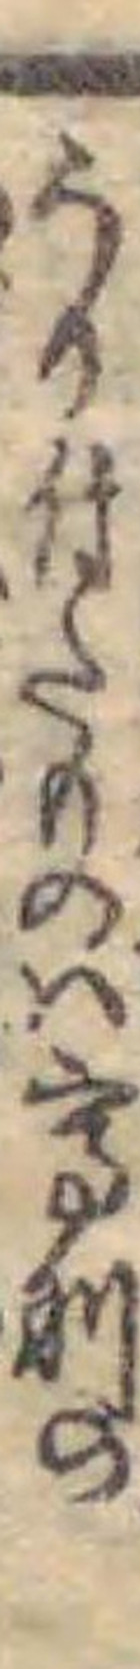うり付たものは高利の
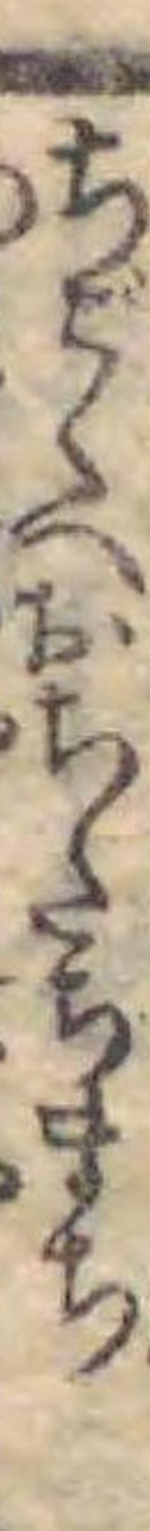ちごくへおちたちまち
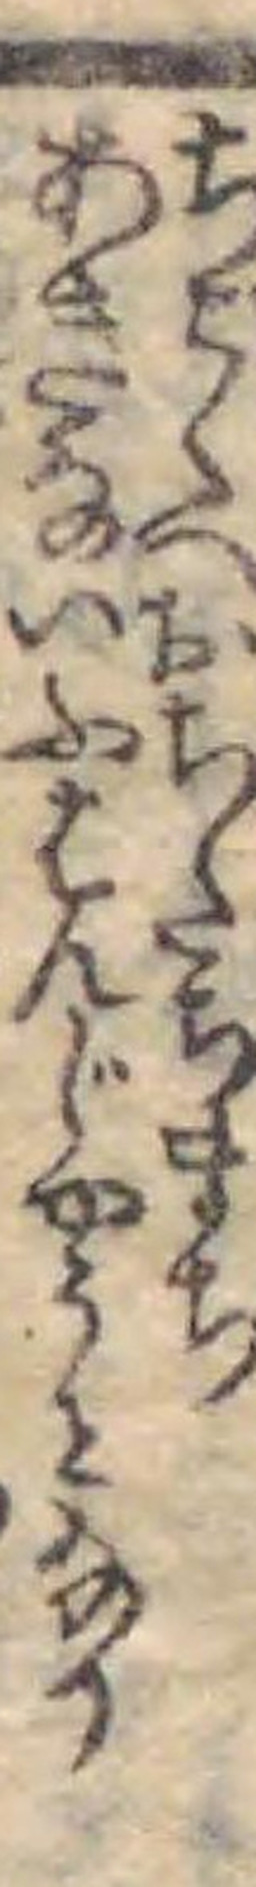あきないふはんじやうとなり
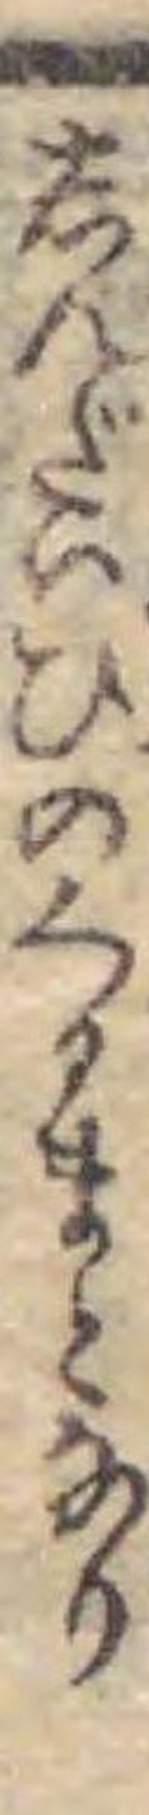しんだいひのくるまとなり
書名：身体開帳略縁起 : 3巻
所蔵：国立国会図書館 National Diet Library, JAPAN
